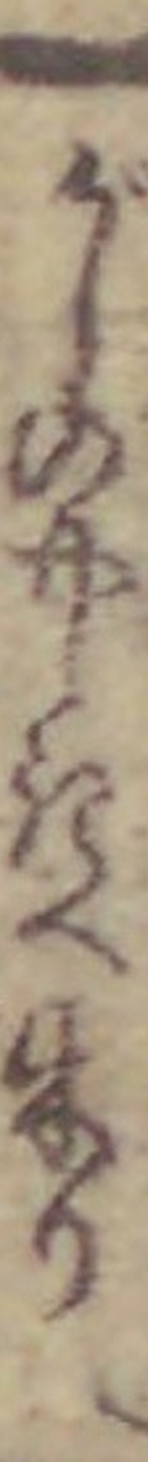がしのやしきへ来り
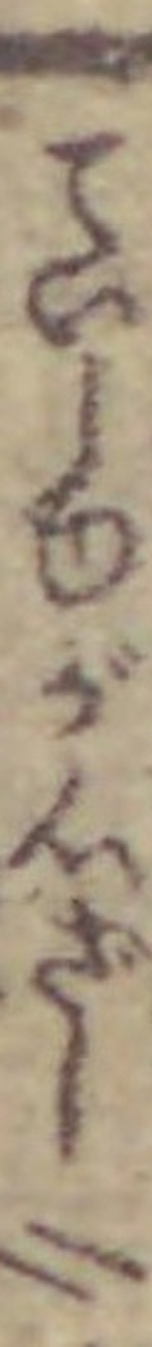ていしゆが心ざし
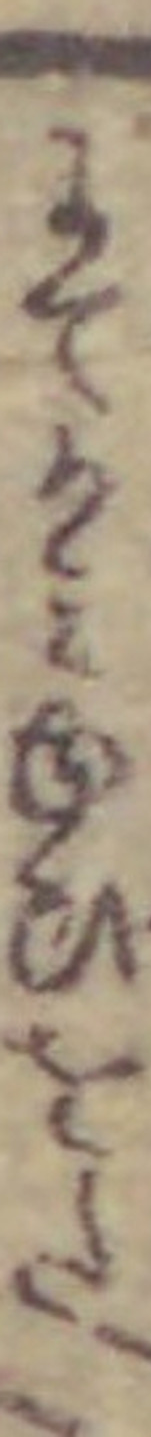にてかみゆひをた
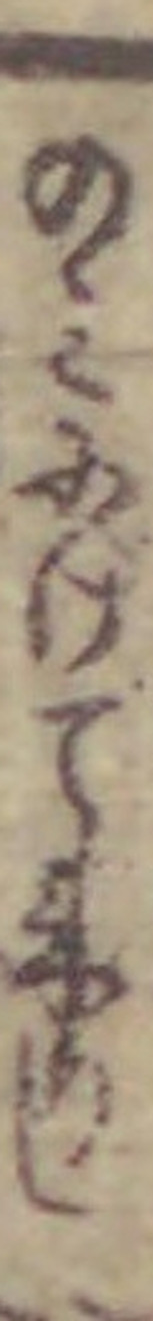のみにけて来りし
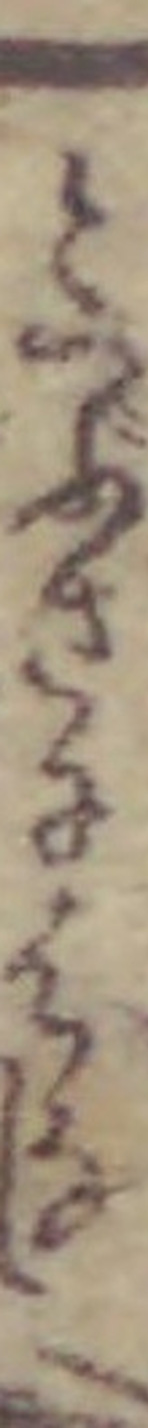とつぶさにはなし
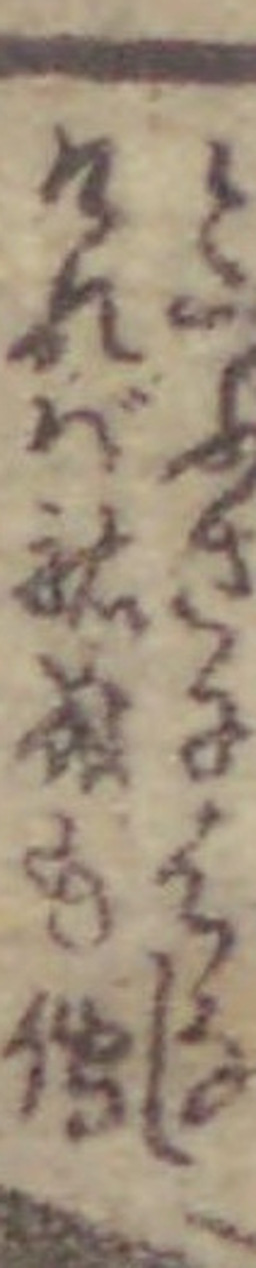ければ祐成も伝
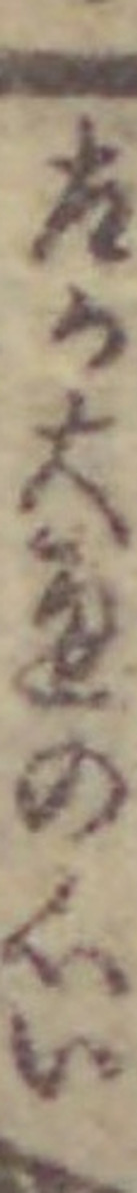左か大通の心い
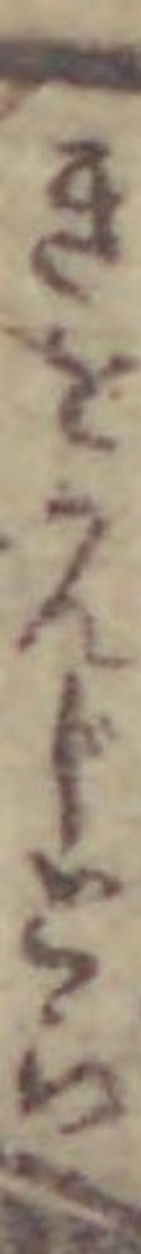きをかんじとら
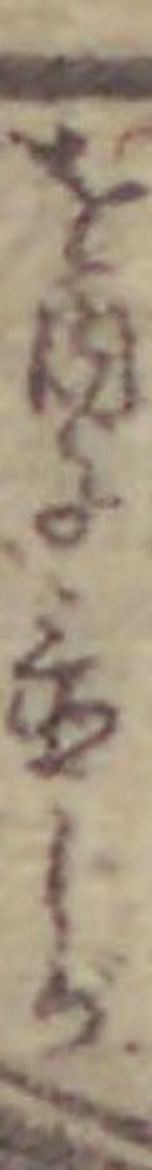を内に置しが
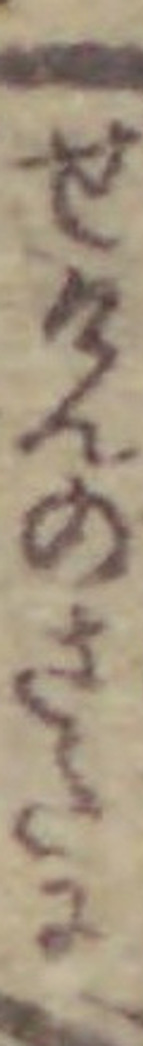せけんのさたに
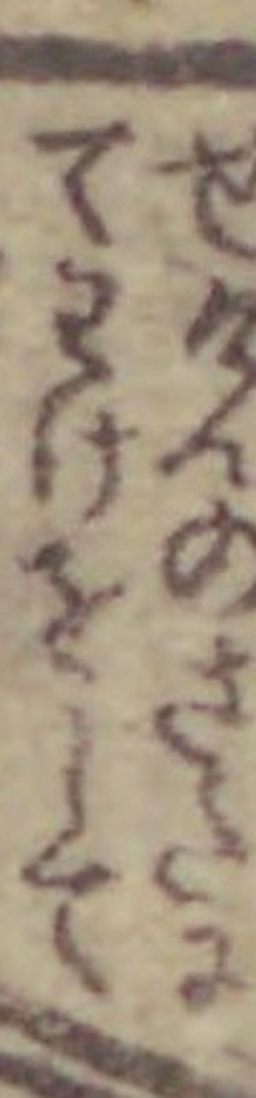てわけをして
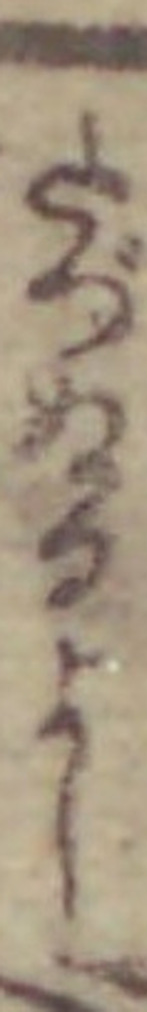たづぬるよし
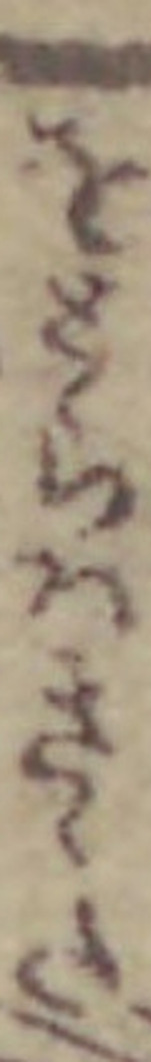をとらはきゝた
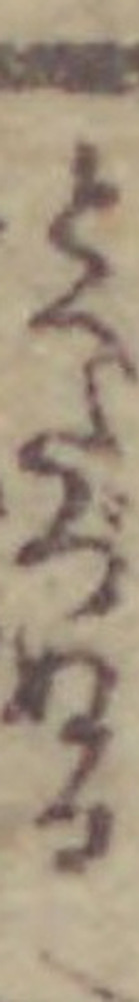とへたづぬる
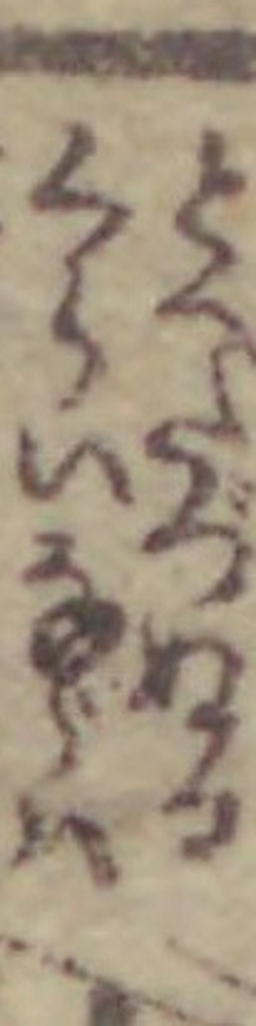くらいならは
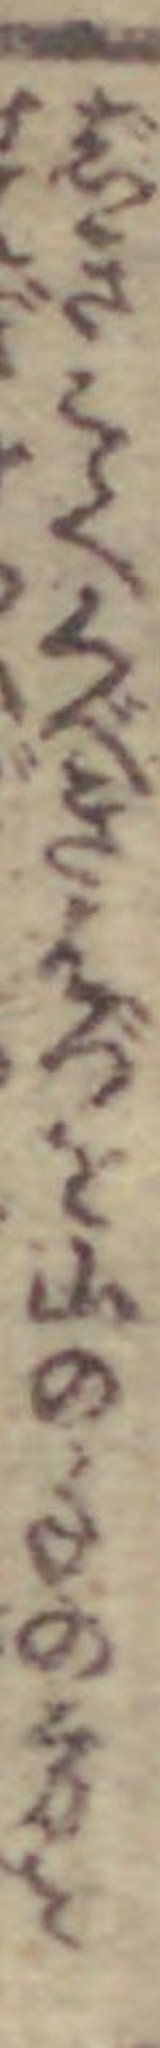じきこゝへくべきはづを山の手の方を
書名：間似合嘘言曽我 3巻
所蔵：国立国会図書館 National Diet Library, JAPAN
